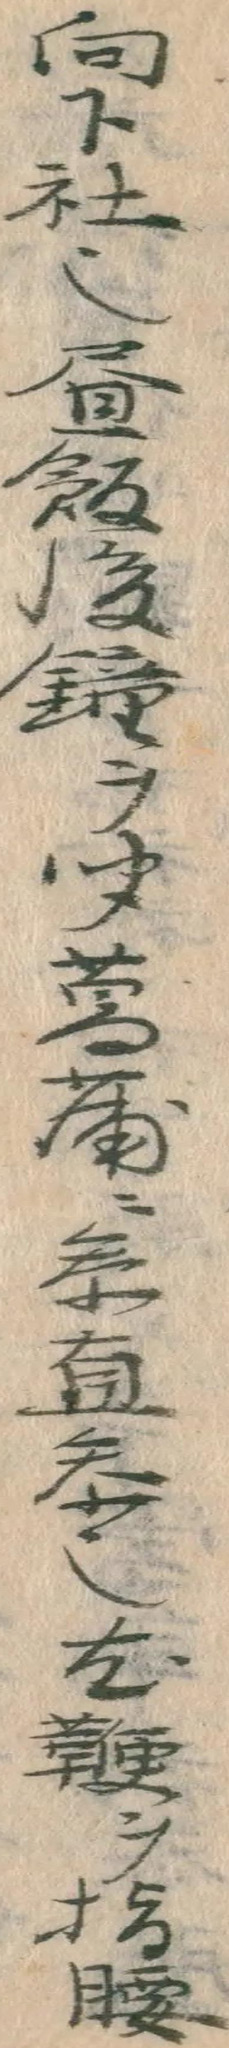向下社也昼飯後鐘ヲ聞菖蒲ニ参直参也尤鞭ヲ指腰
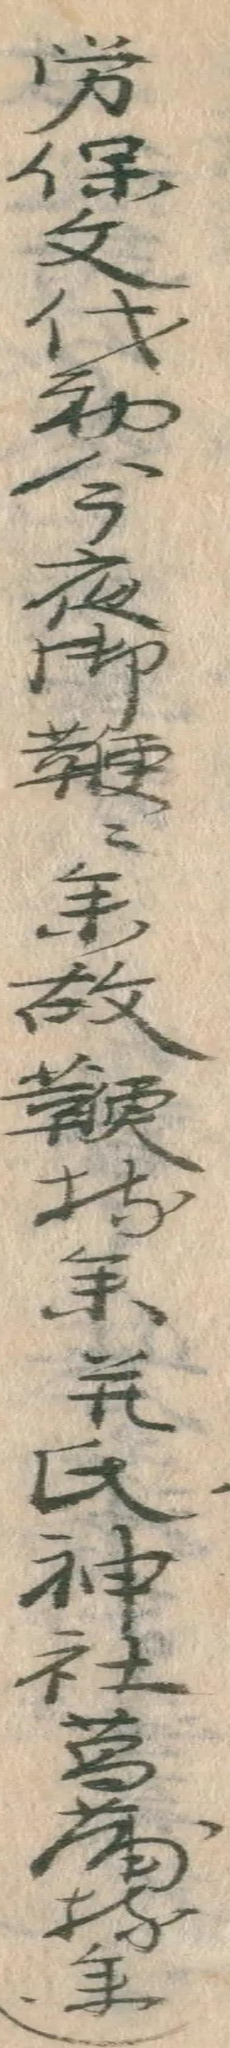労保文代初今夜御鞭ニ参故鞭持参并氏神社菖蒲持参也
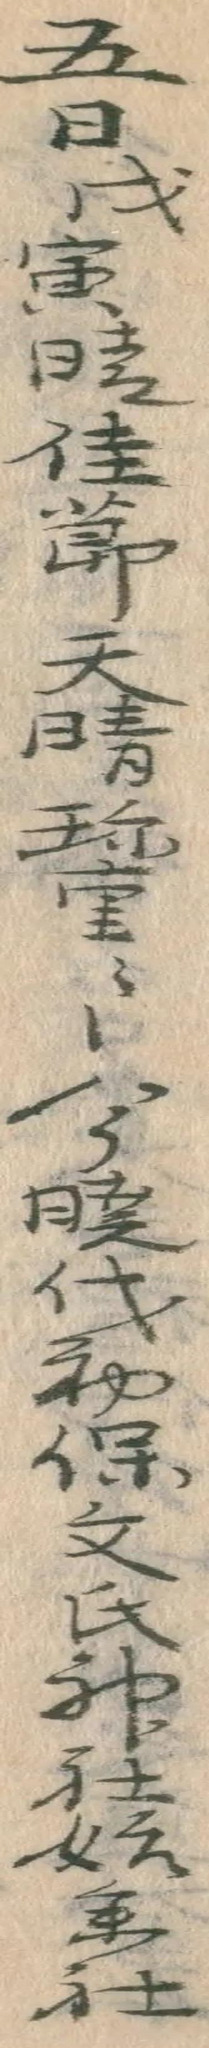五日戊寅晴佳節天晴珎重〻〻今暁代勤保文氏神社始参社
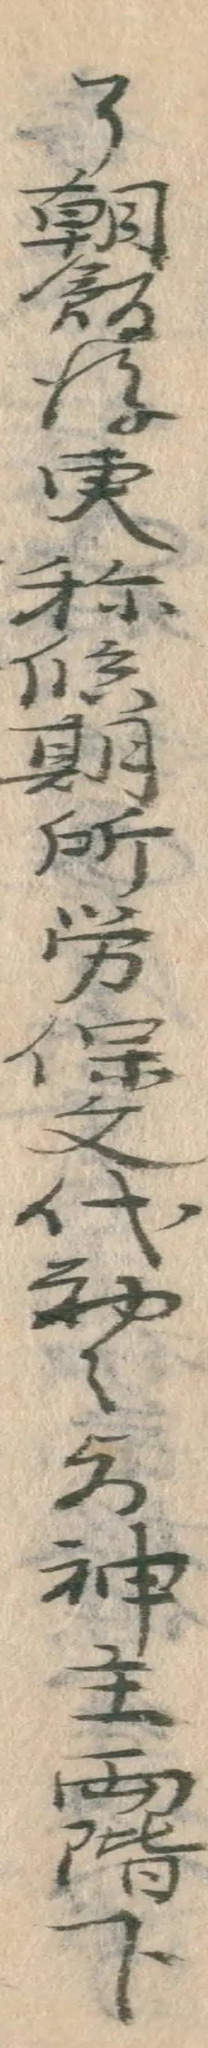了朝飯後更称臨期所労保文代勤之旨神主両階下
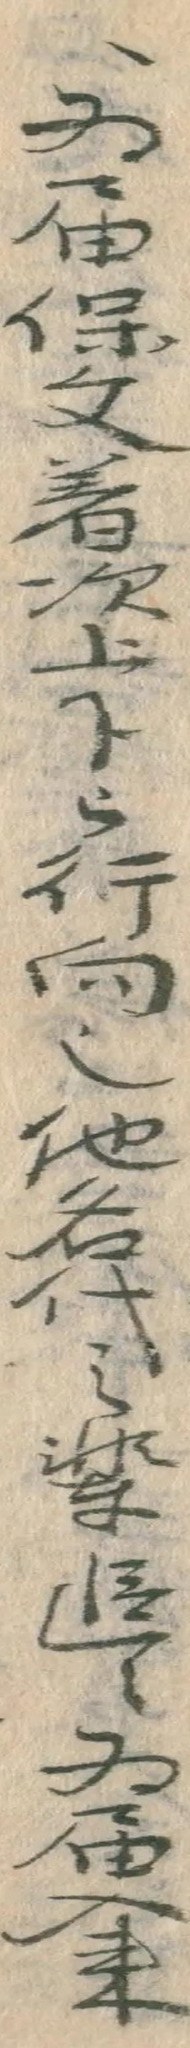へ為届保文著次上下被行向也他名代之輩追〻為届入来
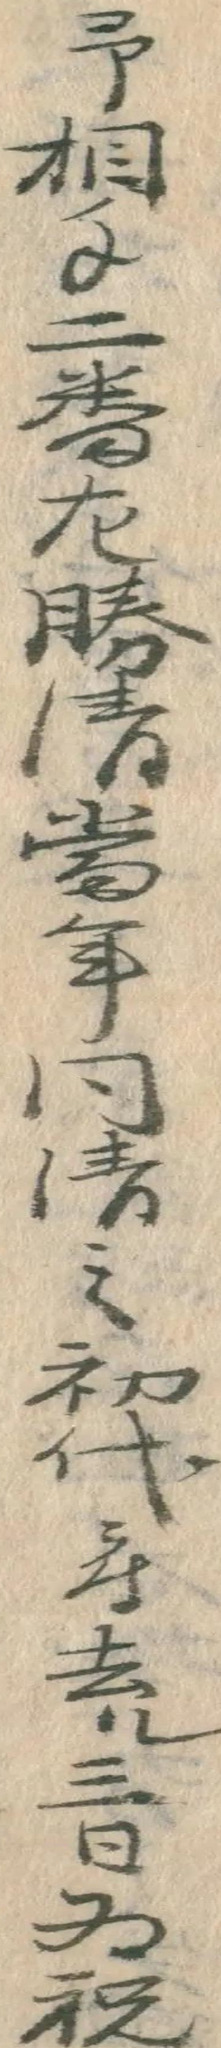予相手二番左勝清當年同清之初代ニ付去ル三日為祝
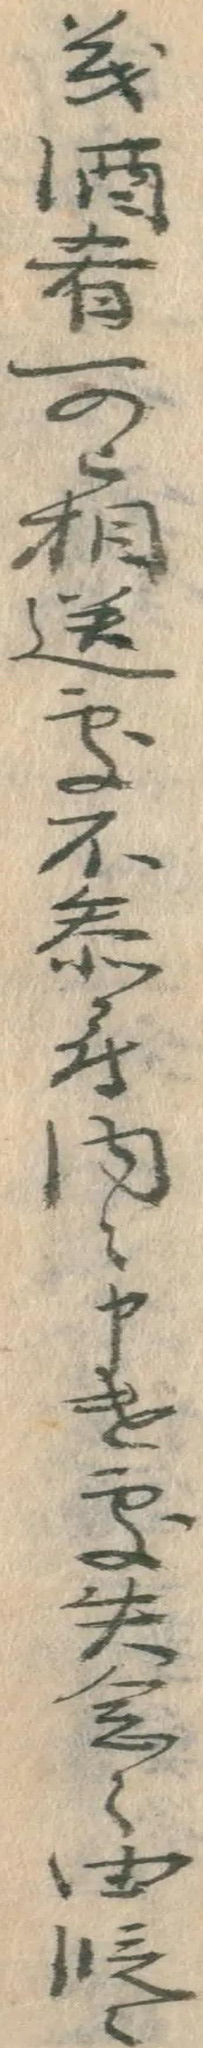義酒肴可被相送處不参ニ付内〻申遣處失念之由段々

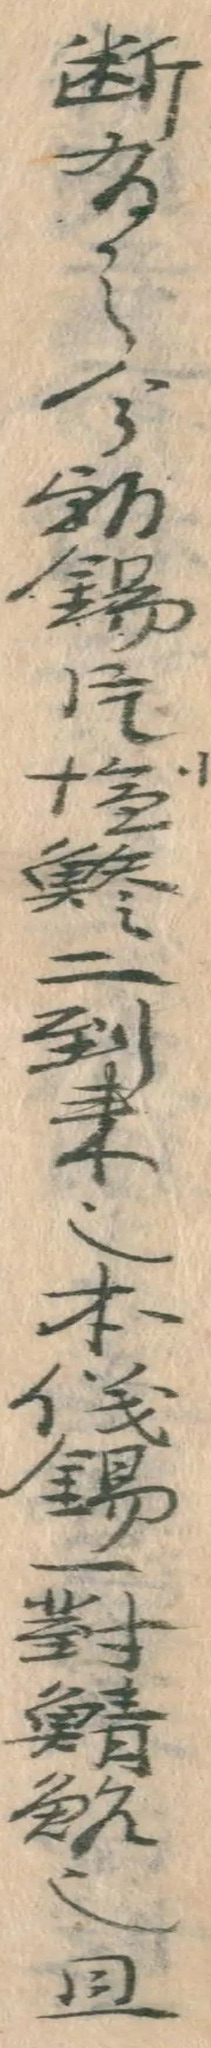断有之今朝錫片小塩鯵二到来也本儀錫一對鯖鮑也且
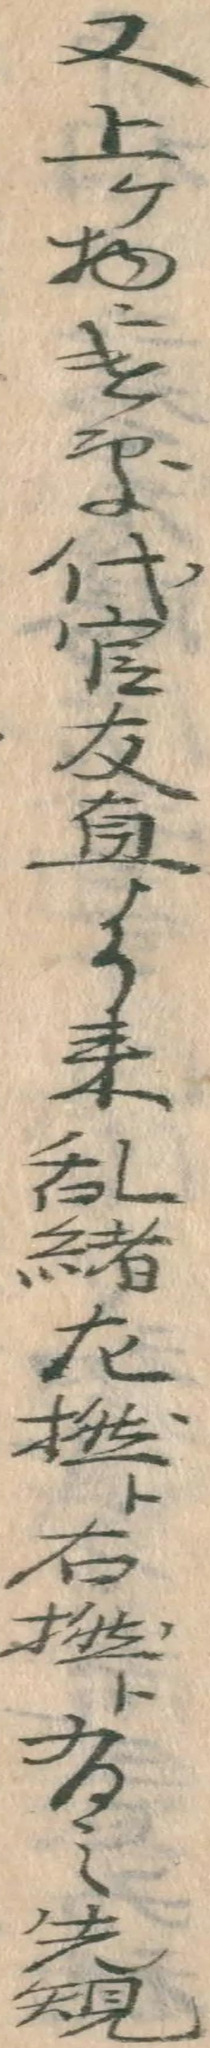又上ケ物ニ遣處代官友直より来乱緒左撰ト右擬ト有之先規
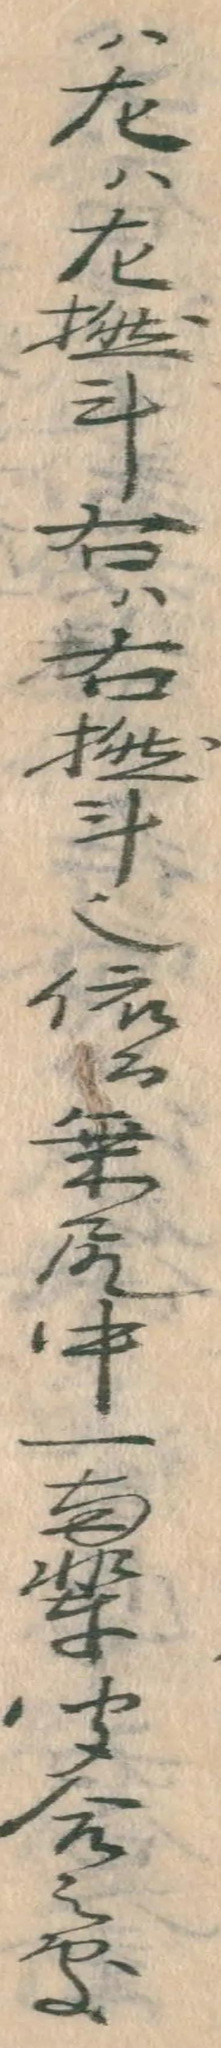ハ左ハ捻斗右ハ右捻斗也依而乗尻中一両輩聞合之處
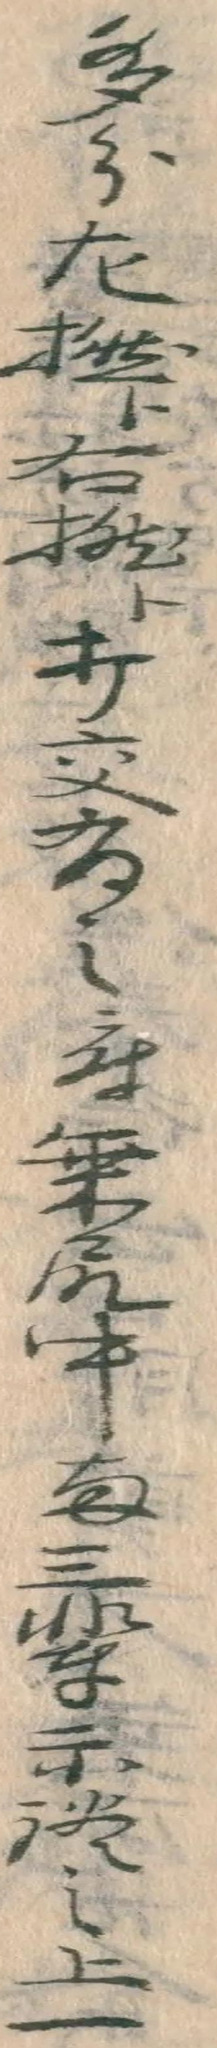多分左捻ト右捻ト打交有之ニ付乗尻中両三輩示談之上一
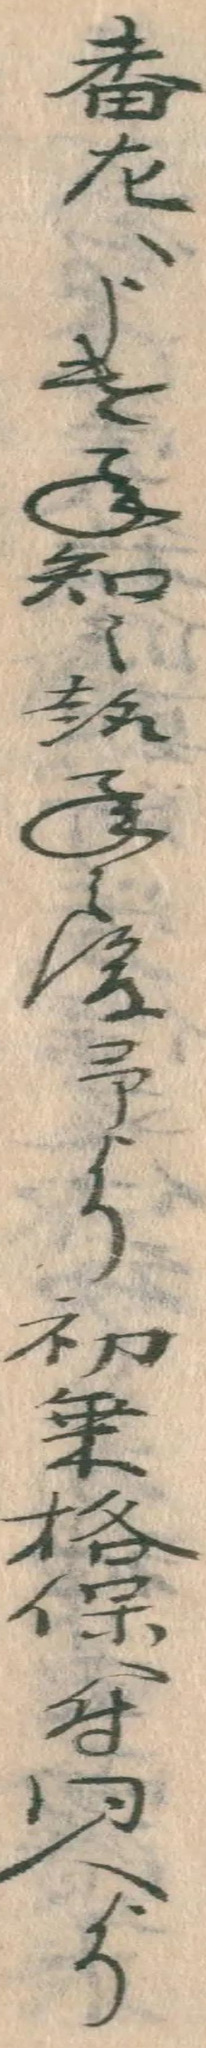番左へ申遣承知之趣承之後予より初乗格保へ付同人より
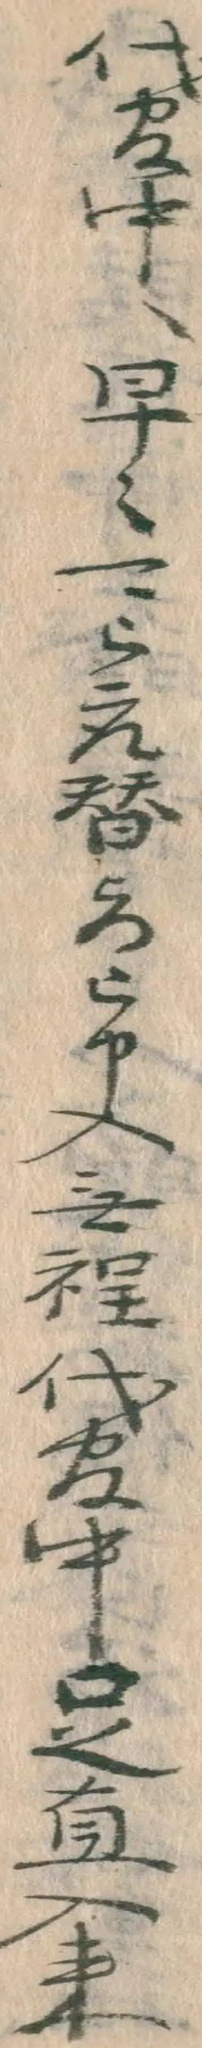代官中へ早々可被取替旨被申入無程代官中足直入来
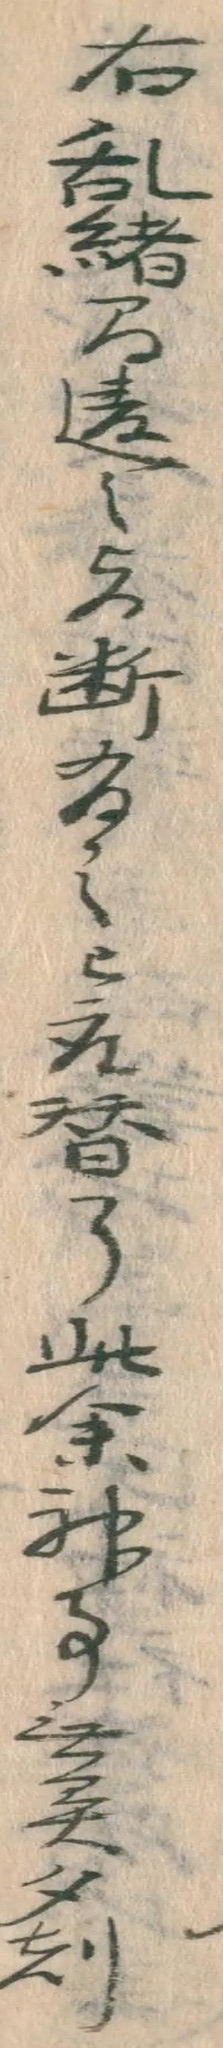右乱緒間違之旨断有之被取替了此余神事無異夕刻
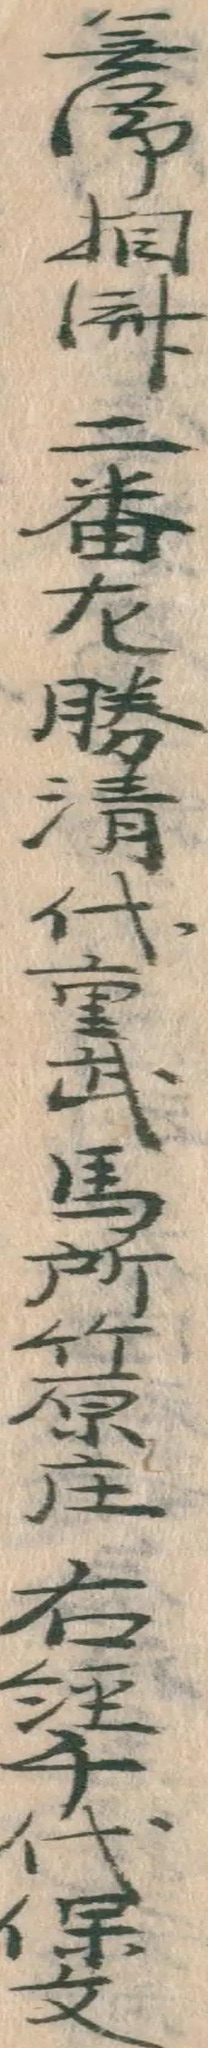無滞相済二番左勝清代重武馬所竹原庄右経千代保文
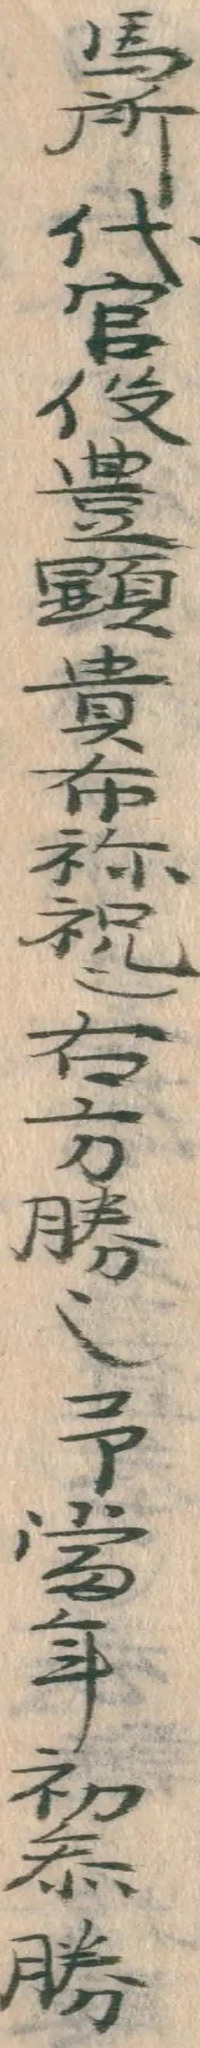馬所代官役豊顕貴布称祝也右方勝也予當年初乗勝
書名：賀茂社記録. 第63冊
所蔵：国立国会図書館 National Diet Library, JAPAN
